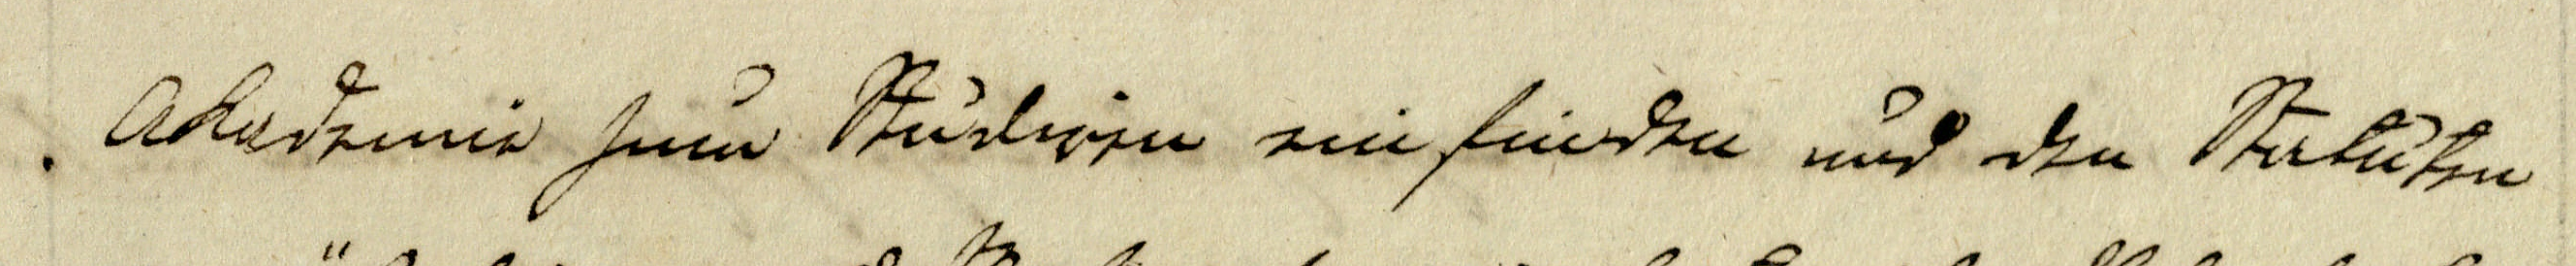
Akademie zum Studiren einfinden und den Statuten
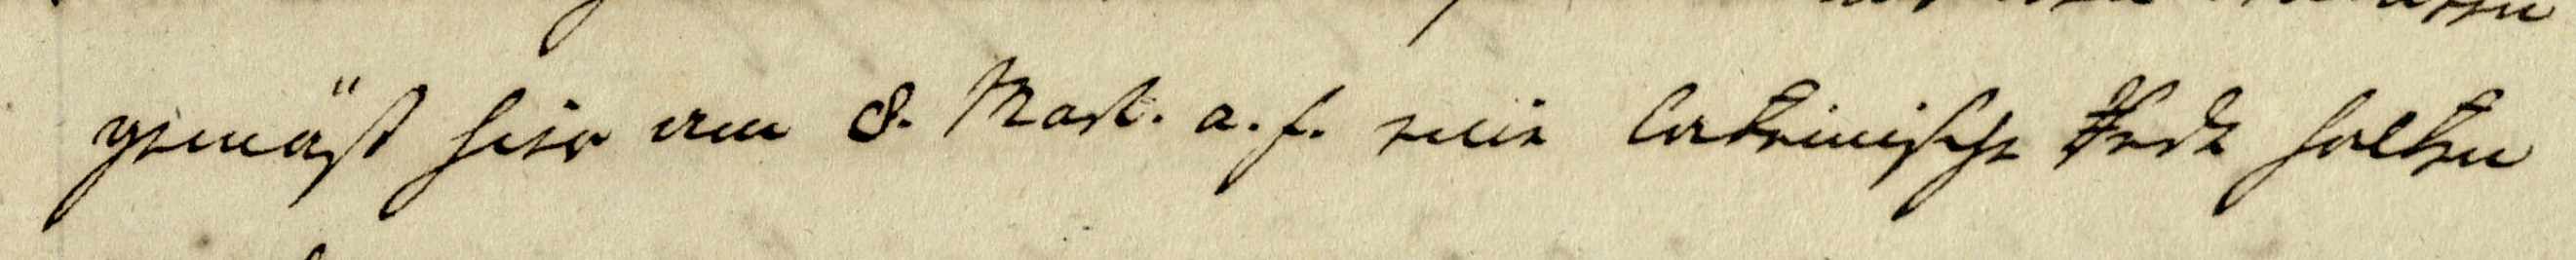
gemäß hier am 8. Mart. a. f. eine lateinische Rede halten
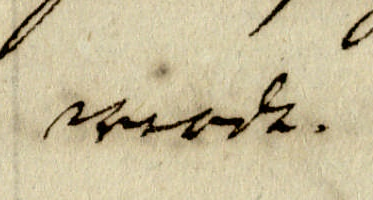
werde.
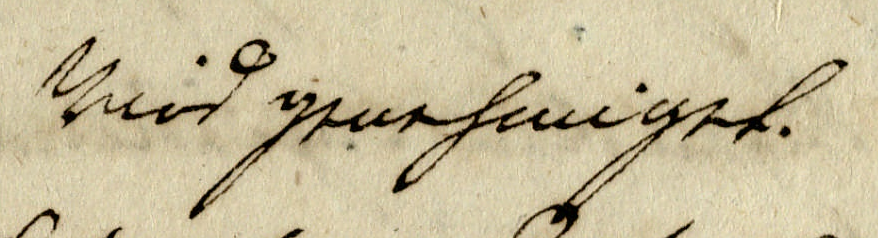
Wird genehmiget.
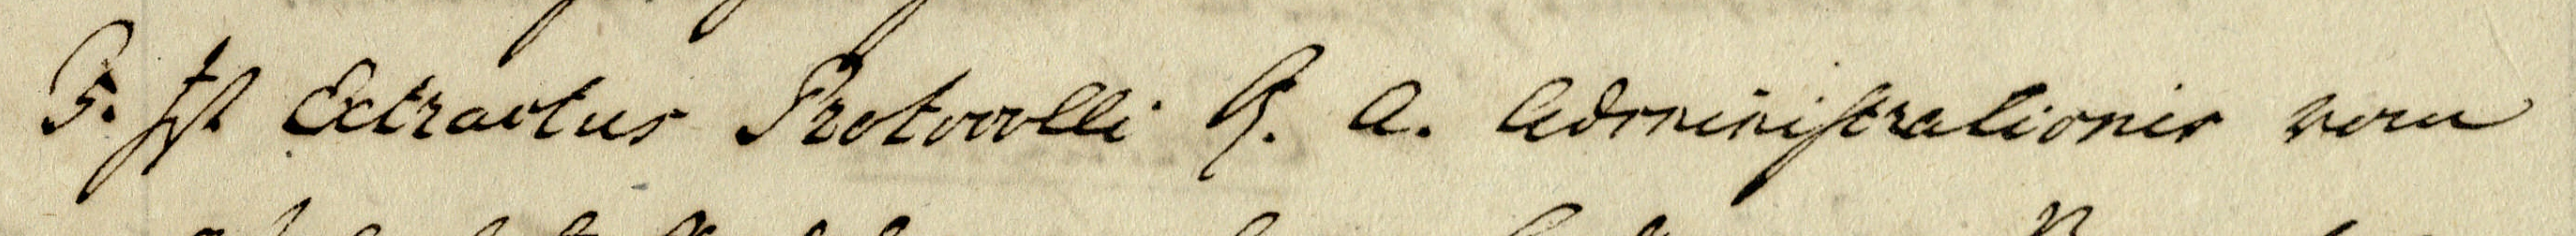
5. Ist Extractus Protocolli K. A. Administrationis vom
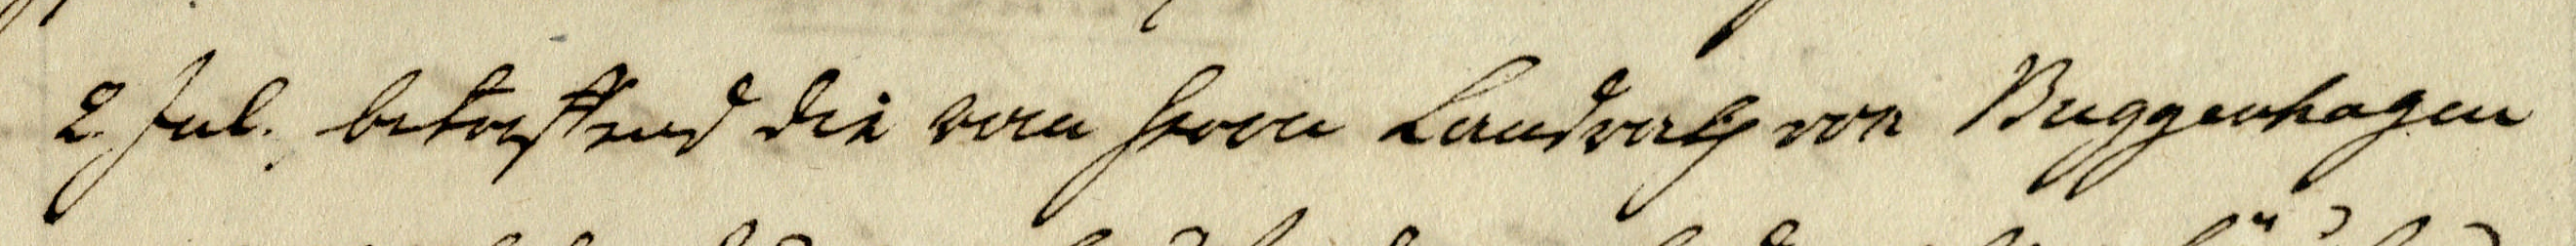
2. Jul. betreffend die vom Herrn Landrath von Buggenhagen
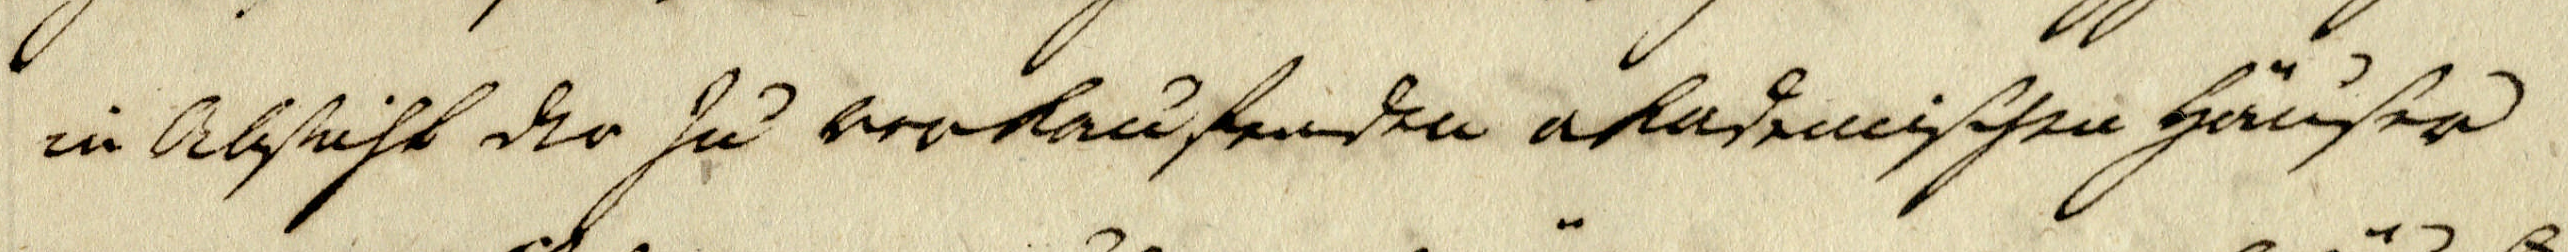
in Absicht der zu verkaufenden akademischen Häuser
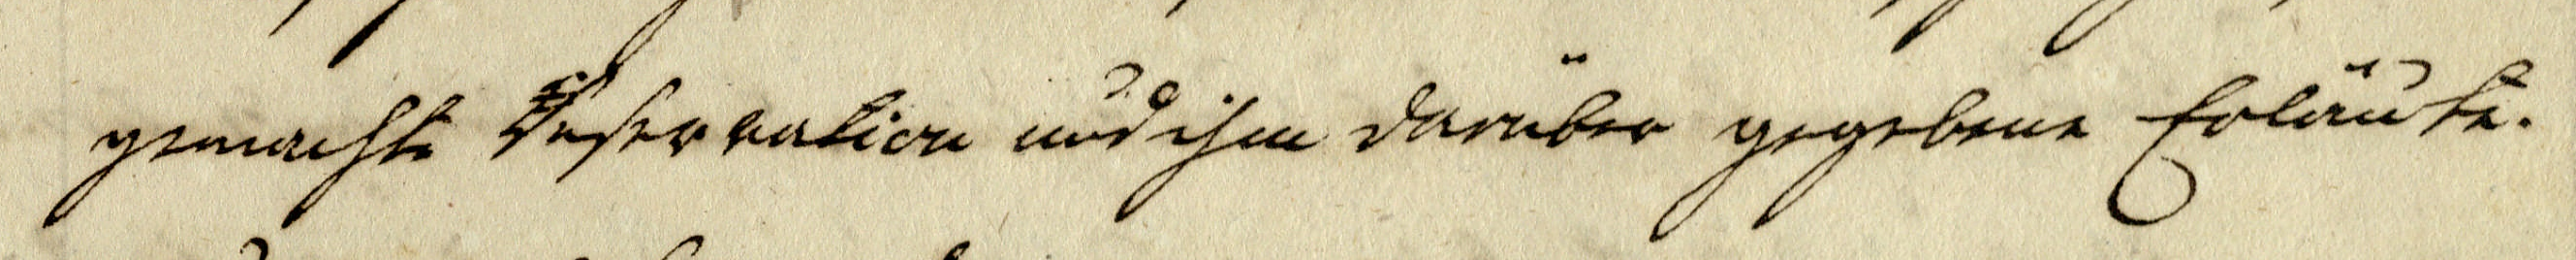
gemachte Reservation und ihm darüber gegebene Erläute¬
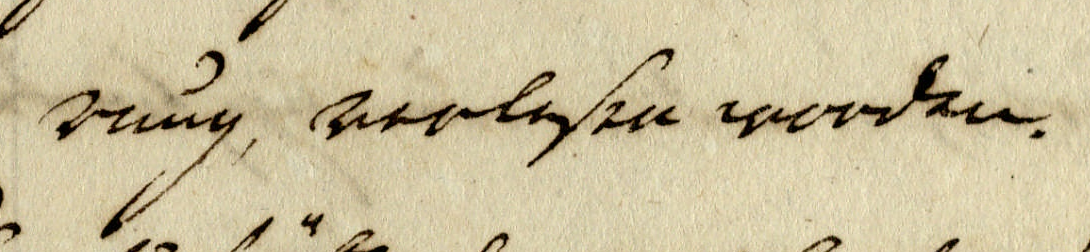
rung, verlesen worden.
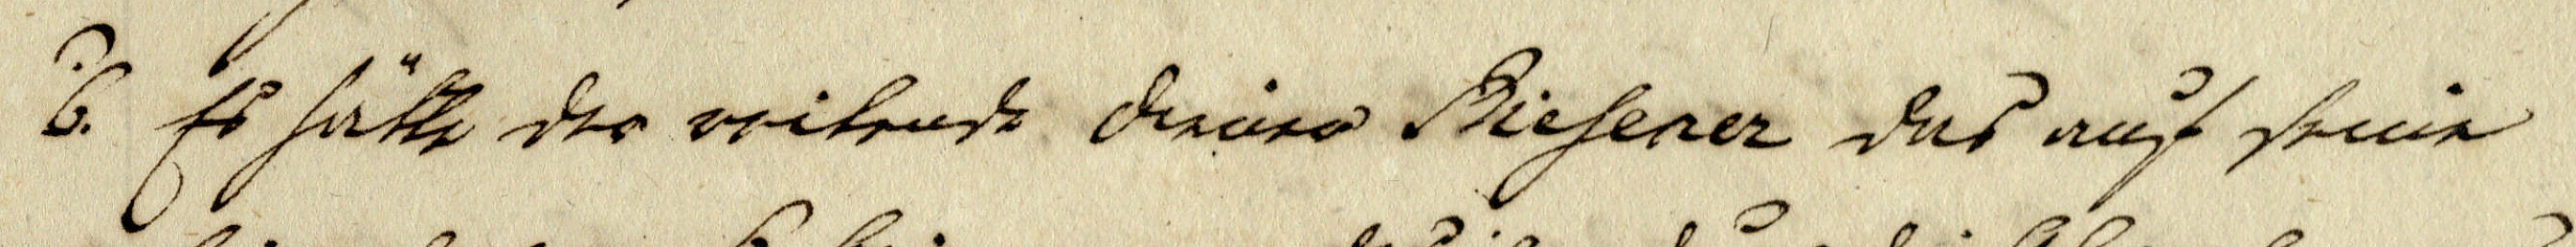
6. Es hätte der reitende Diener Biesener das auf seine
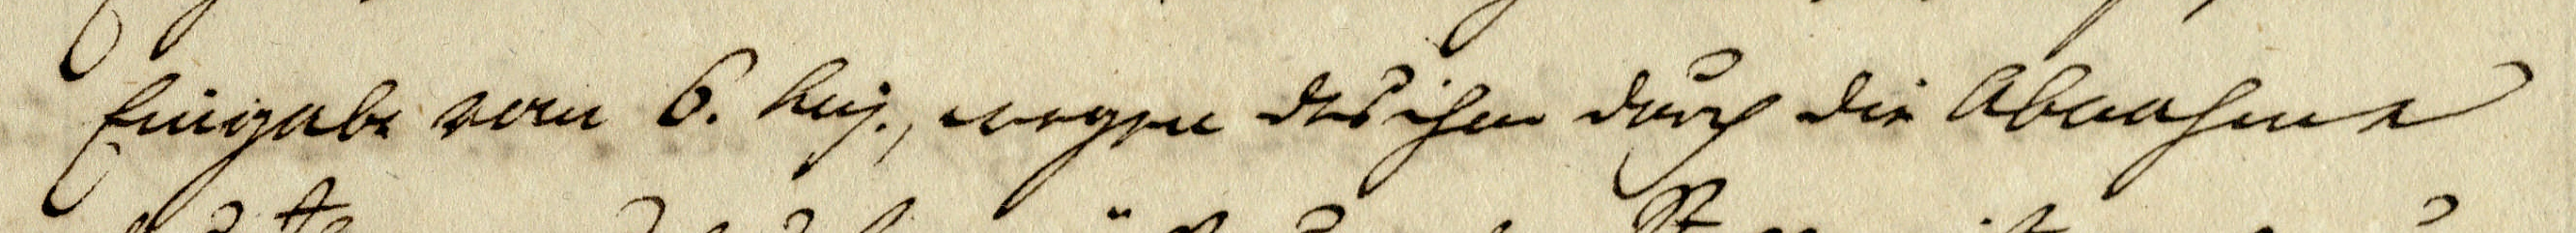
Eingabe vom 6. huj., wegen des ihm durch die Abnahme
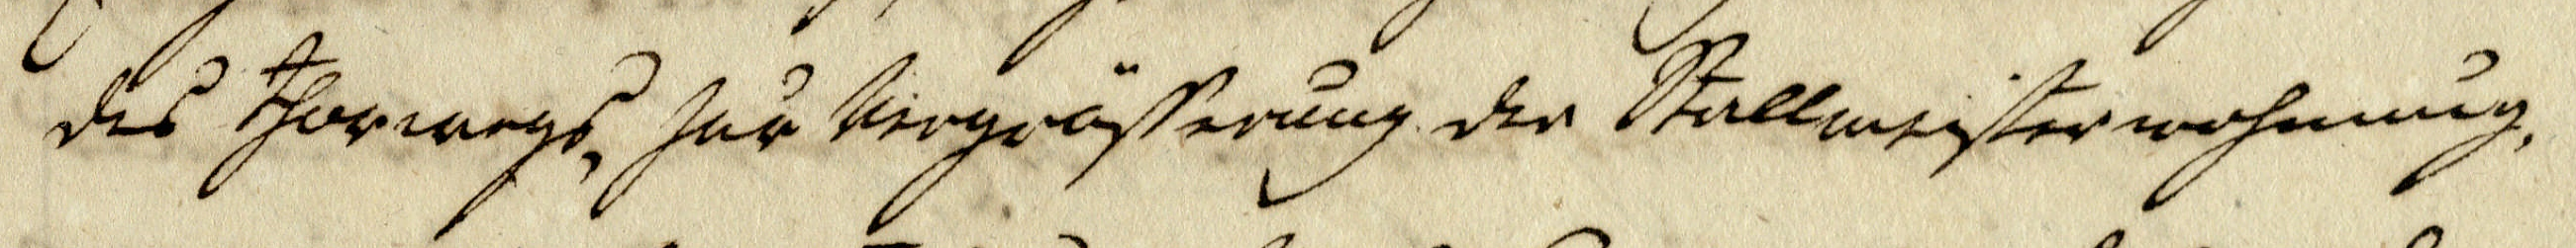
des Thorwegs, zur Vergrösserung der Stallmeisterwohnung,
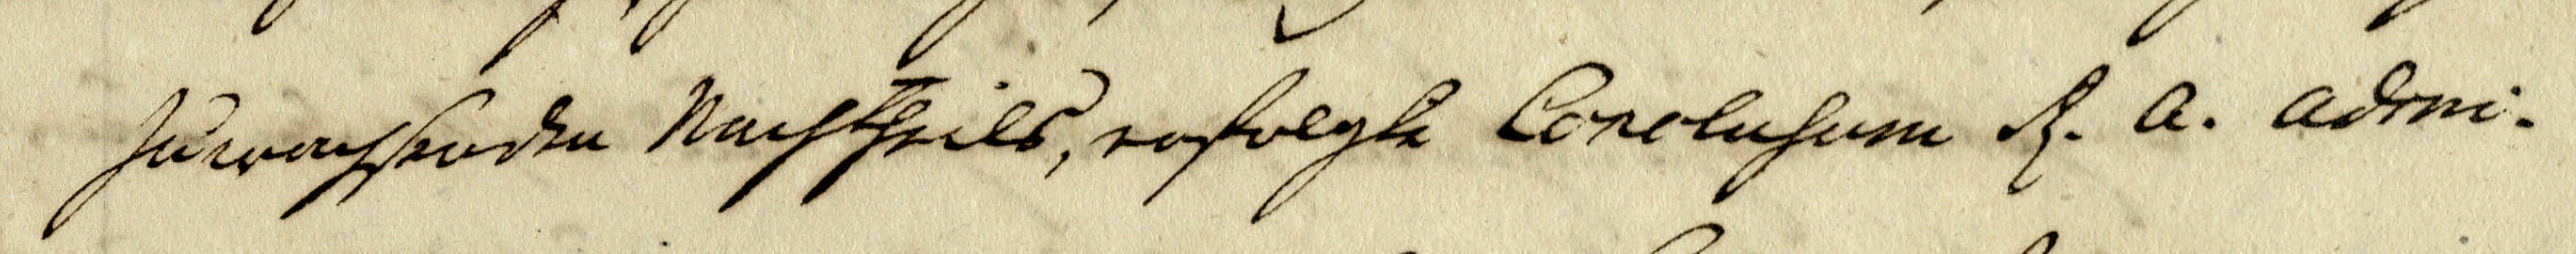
zuwachsenden Nachtheils, erfolgte Conclusum K. A. Admi¬
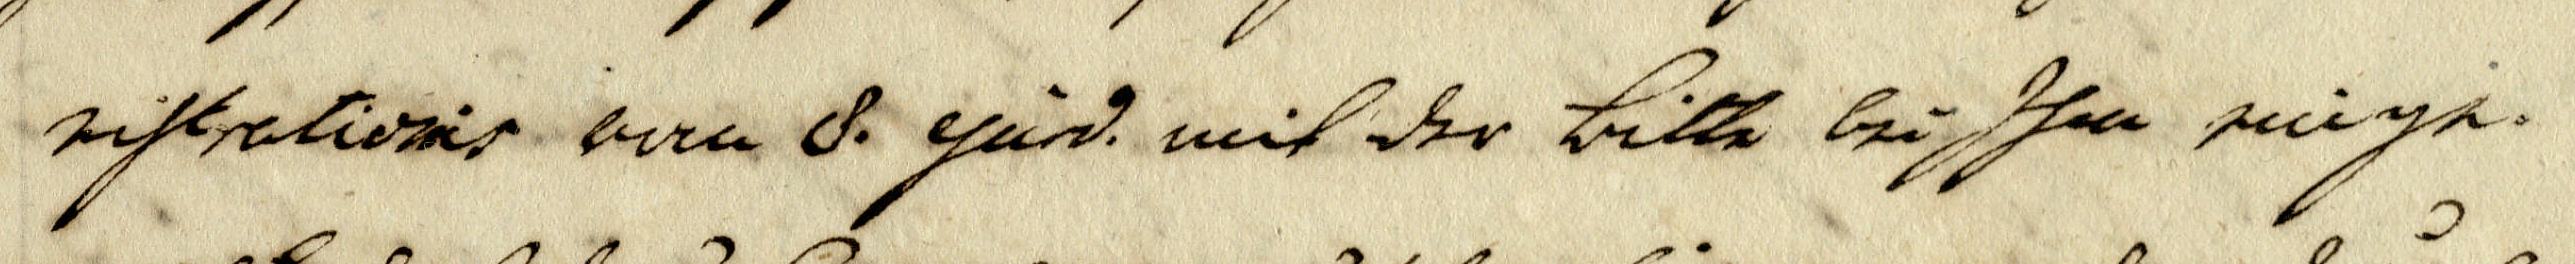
nistrationis von 8. ejusd. mit der Bitte bei Ihm einge¬
